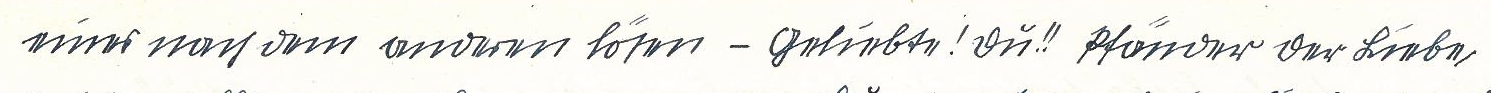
eines nach dem anderen lösen – Geliebte! Du!! Pfänder der Liebe,
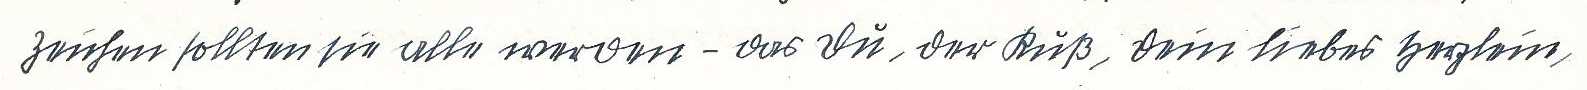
Zeichen sollten sie alle werden – das Du, der Kuß, Dein liebes Herzlein,
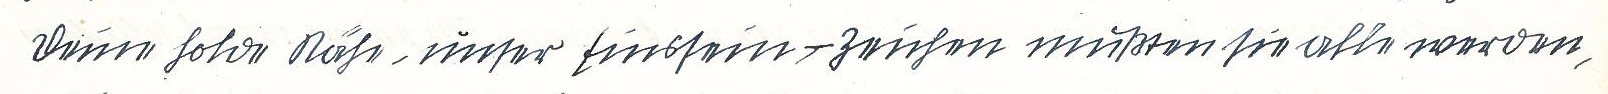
Deine holde Nähe, unser Einssein – Zeichen mußten sie alle werden,
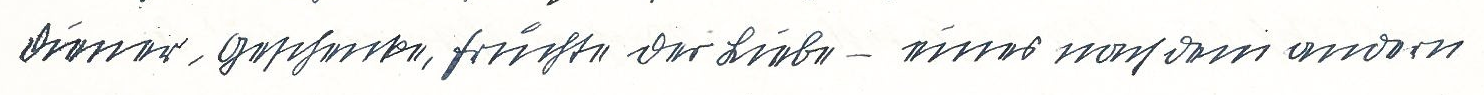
Diener, Geschenke, Früchte der Liebe – eines nach dem andern
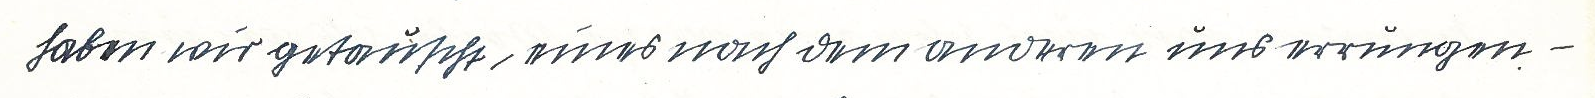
haben wir getauscht, eines nach dem anderen uns errungen –
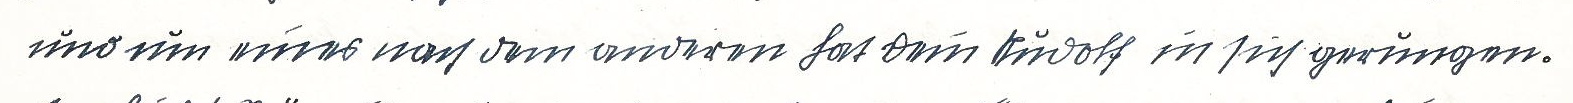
und um eines nach dem anderen hat Dein in sich gerungen.
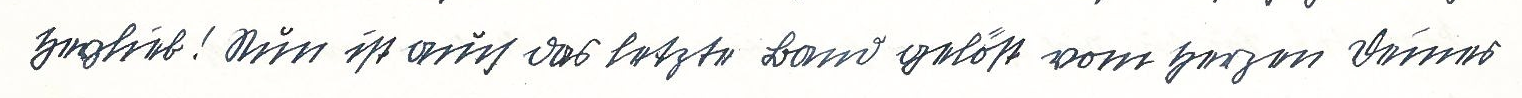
Herzlieb! Nun ist auch das letzte Band gelöst vom Herzen Deines
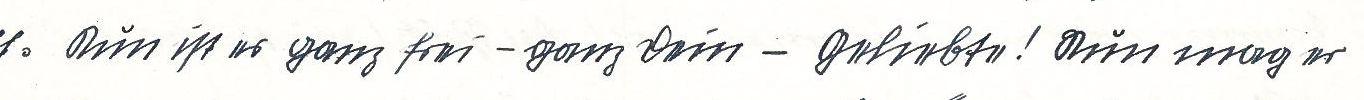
. Nun ist er ganz frei – ganz Dein – Geliebte! Nun mag er
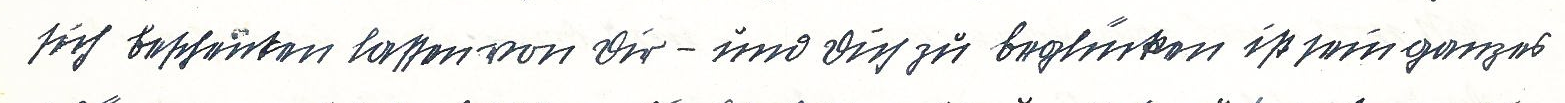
sich beschenken lassen von Dir – und Dich zu beglücken ist sein ganzes
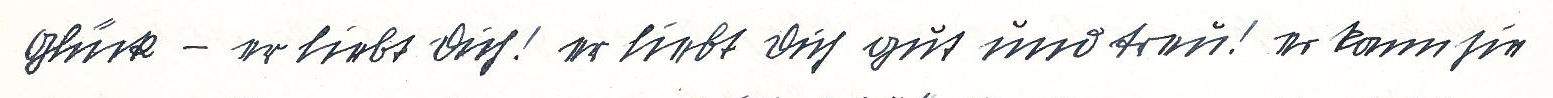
Glück – er liebt Dich! er liebt Dich gut und treu! er kann sie
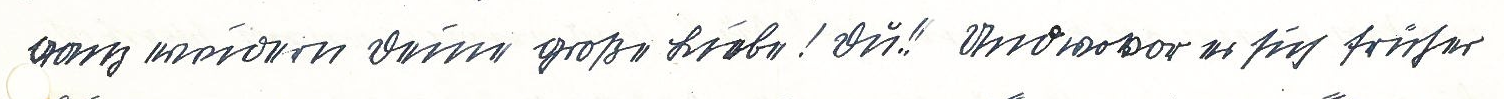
ganz erwidern Deine große Liebe! Du!! Und wovor er sich früher
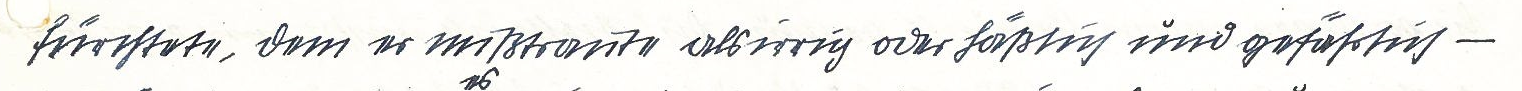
fürchtete, dem er mißtraute als irrig oder häßlich und gefährlich –
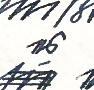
es
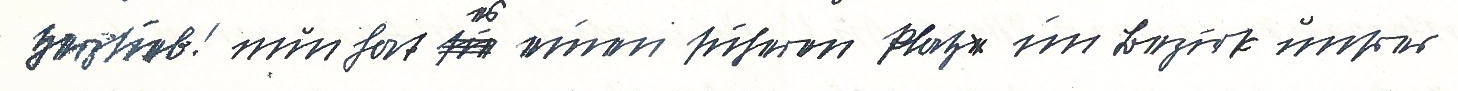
Herzlieb! Nun hat sie einen sicheren Platze im Bezirk unsrer
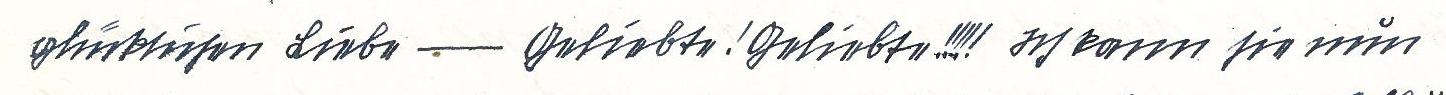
glücklichen Liebe – – – Geliebte! Geliebte!!!!! Ich kann sie nun
